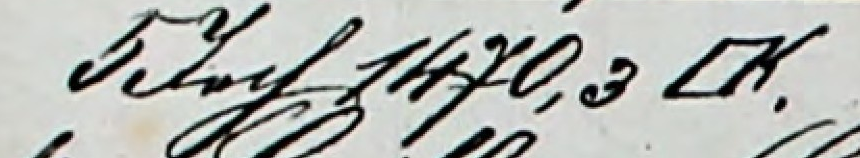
5 Joch 1470, 3 K.
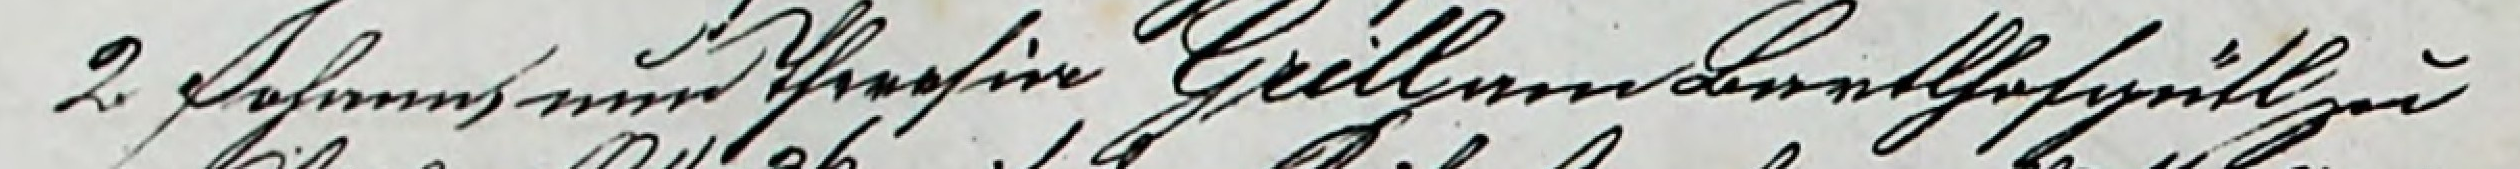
2. Johann und Theresia Grill am Bartlhofgütl zu
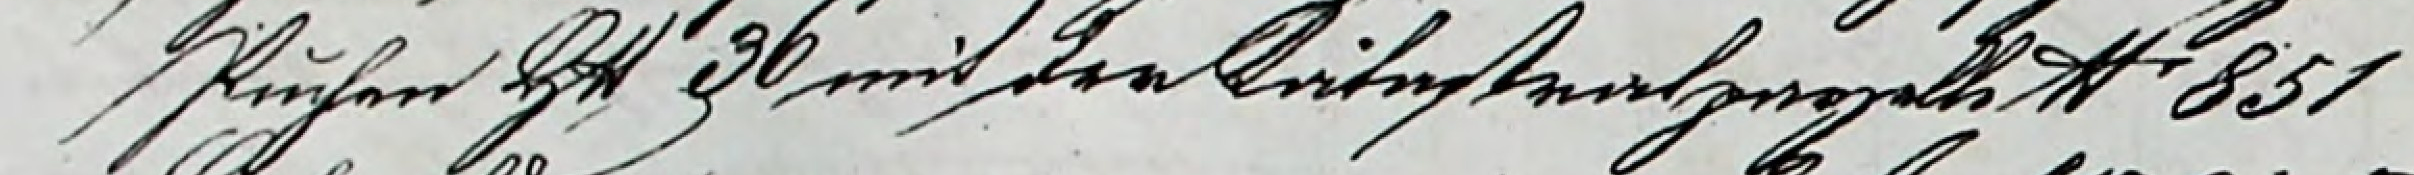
Puchen Htt 36 mit der Kritastratparzelle tt 851
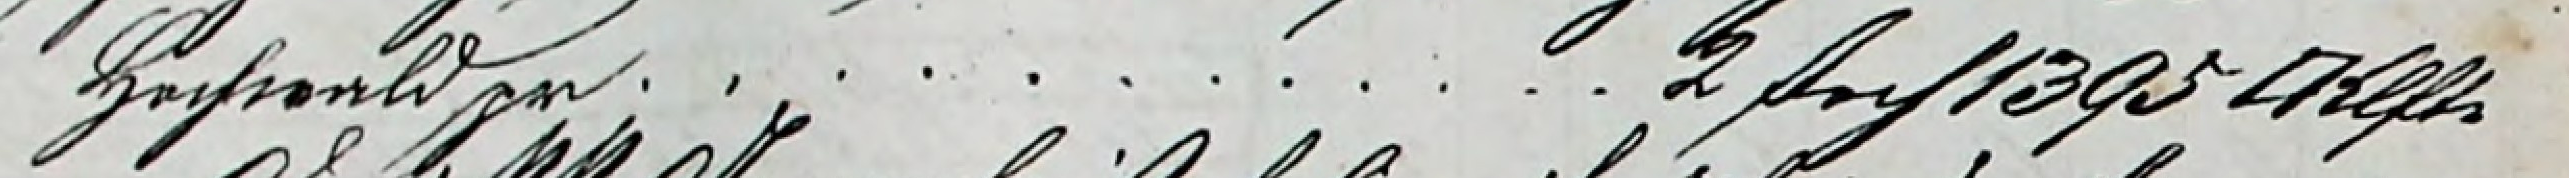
Hochwald pr .... 2 Joch 1395 Klfte
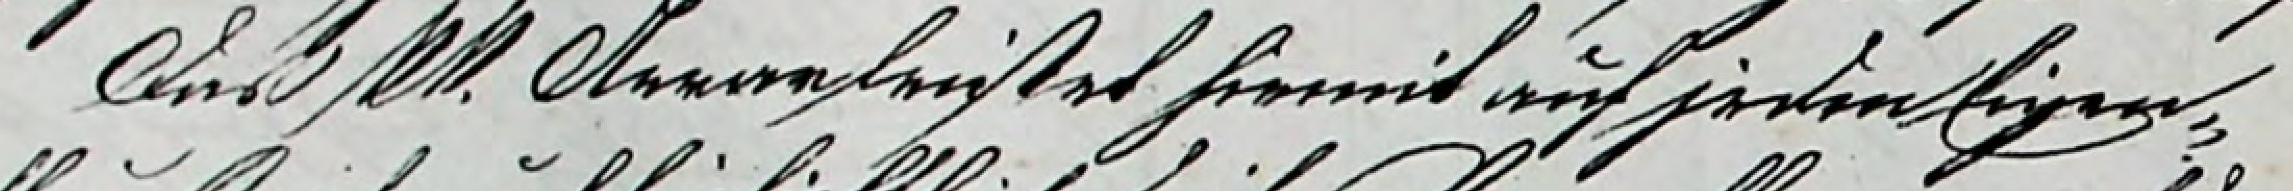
Das kk. Aerarleistet hiemit auf jeden Eigen„
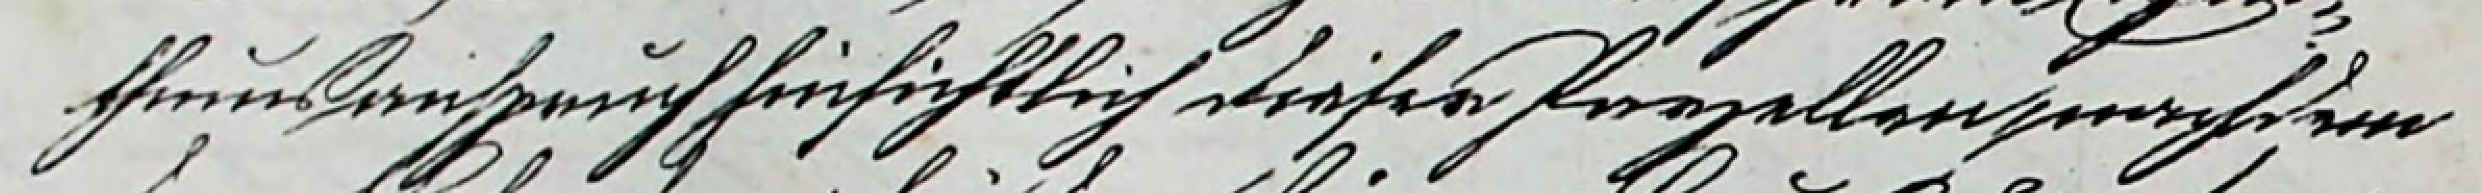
thumsanspruch hinsichtlich dieser Parzellen nach dem
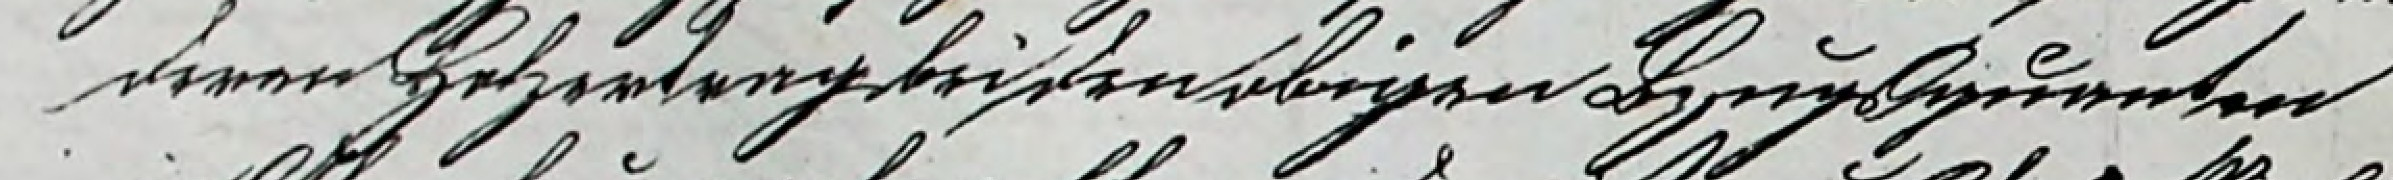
deren Hetzertrag drei den obigen Bezugsquanten
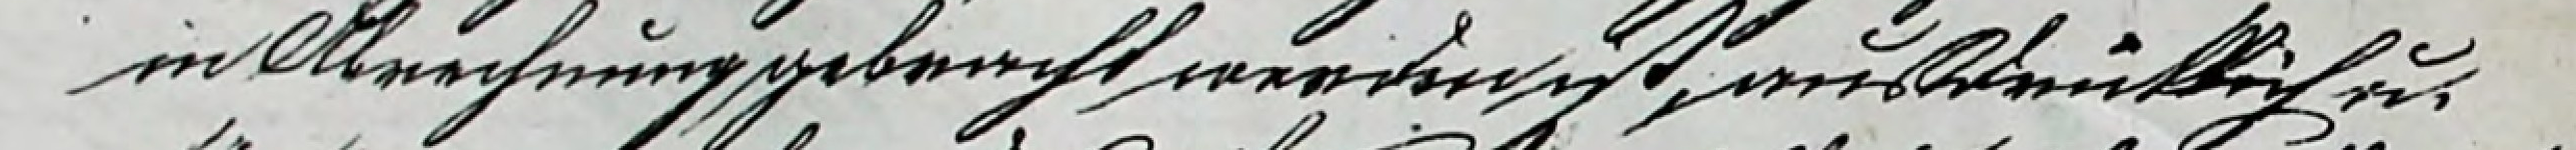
in Abrechnung gebracht werden ist, ausdrücklich u.
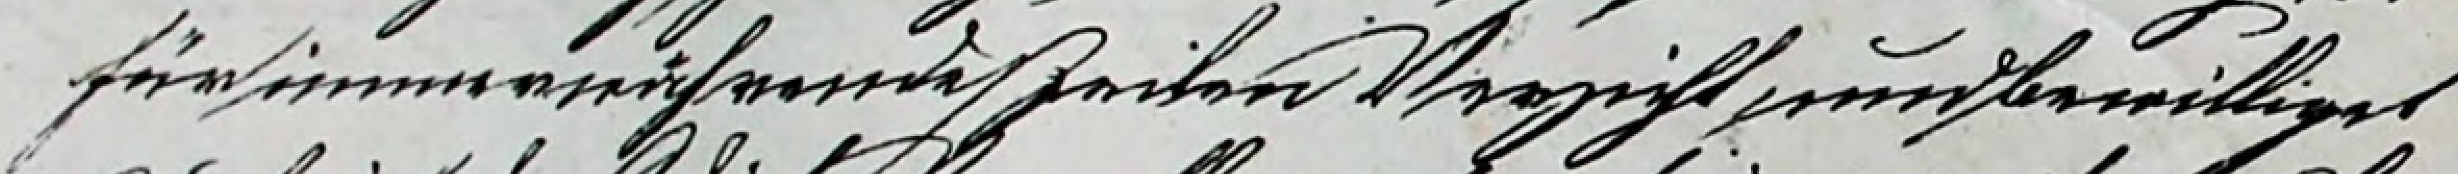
für immer rührende Zeiten Verzicht und bewilliget
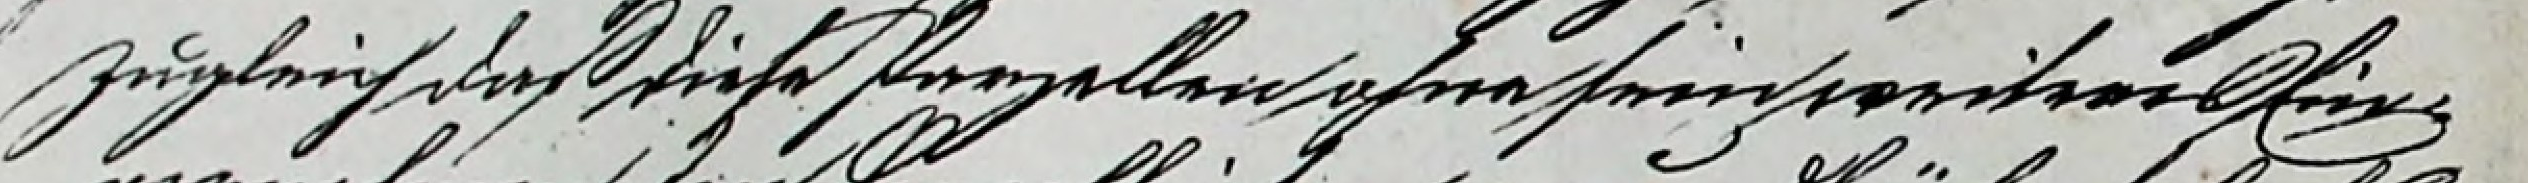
zugleich daß diese Parzellen ohne sein weiteres Ein„
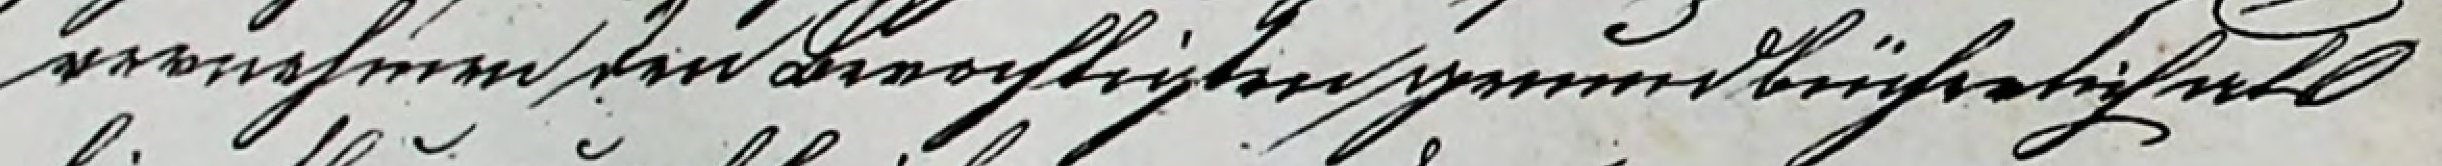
vernehmen den Berechtigten Grundbücher??? als
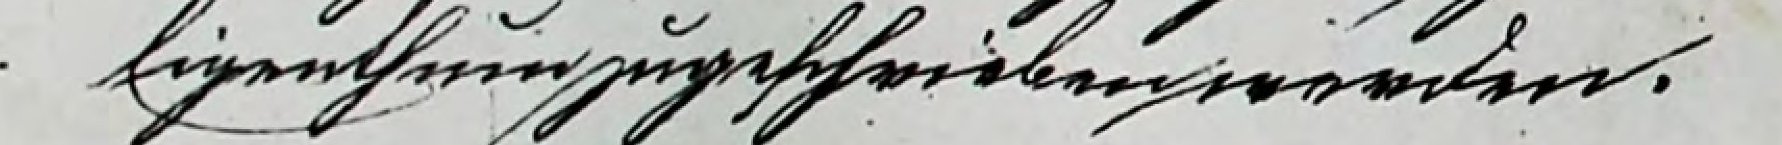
Eigenthum zugeschrieben werden.
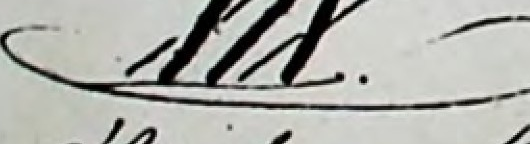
XIX.
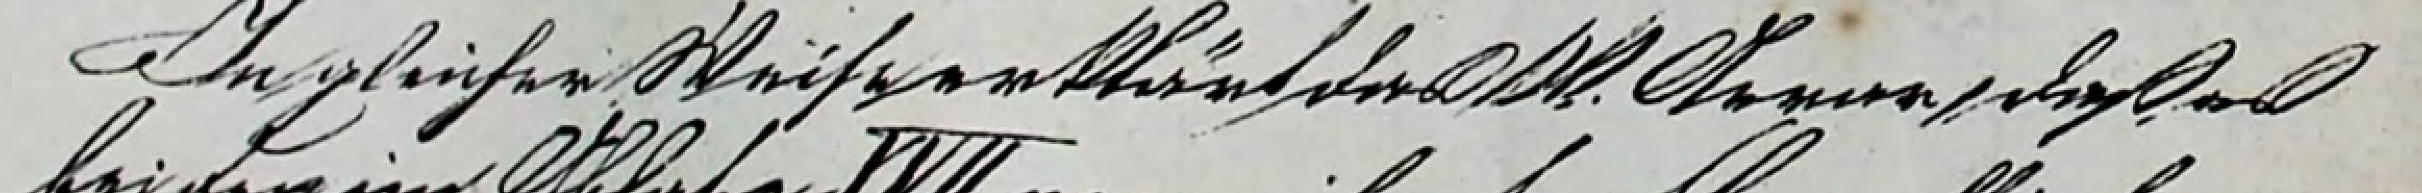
Ingleicher Weise erklärt das W. Aerar, daß es
